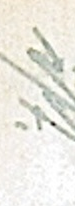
ist.
